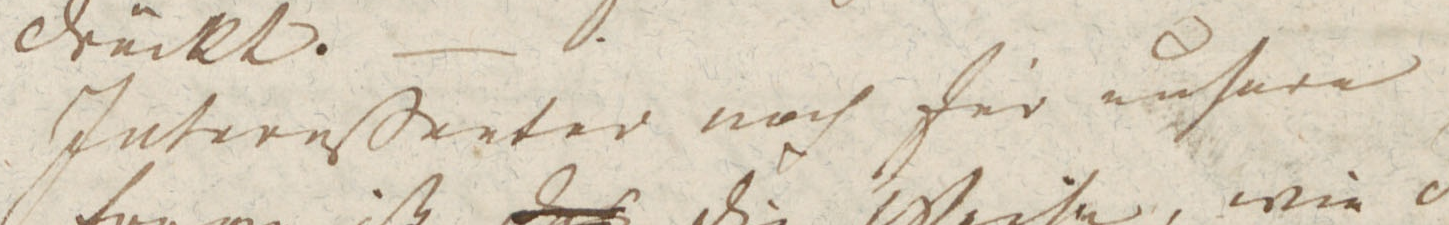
Interessanter noch für unsere
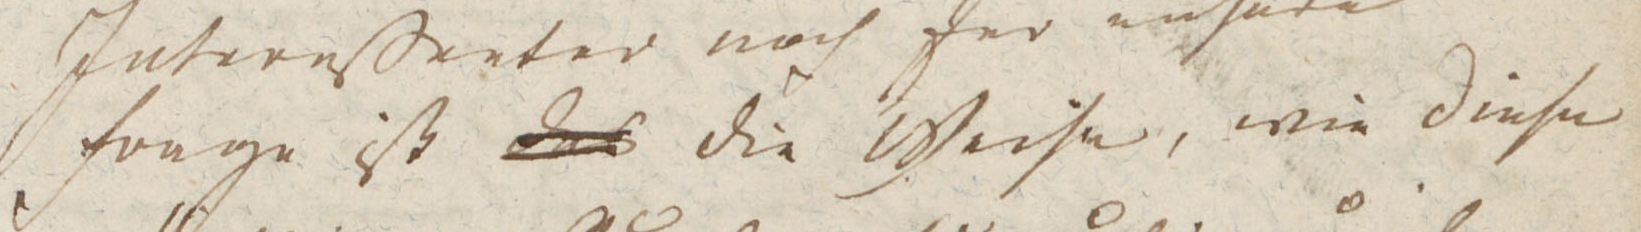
Frage ist das die Weise, wie diese
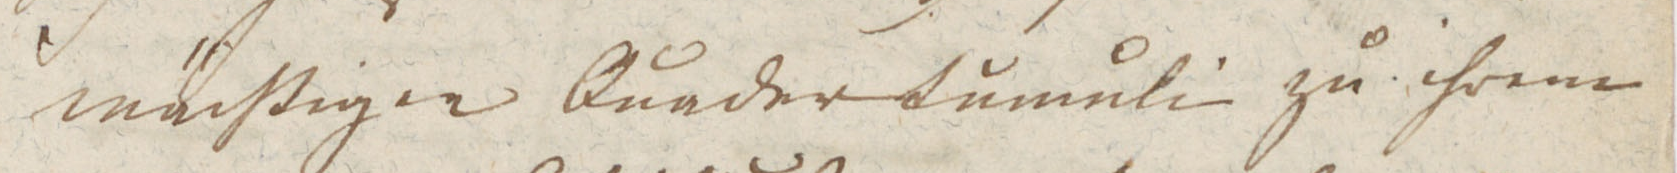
mächtigen Quadertumuli zu ihrem
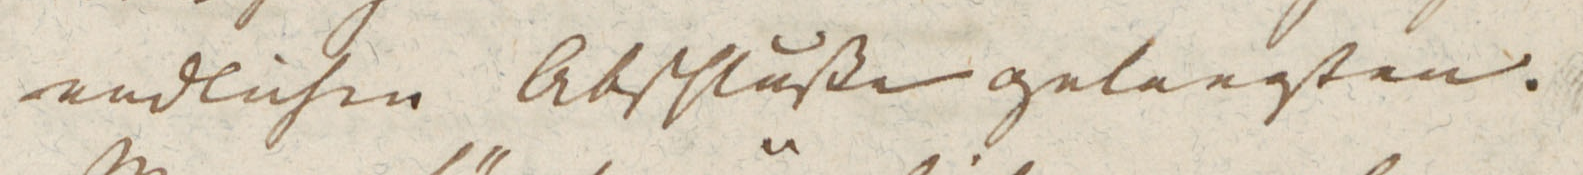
endlichen Abschlusse gelangten.
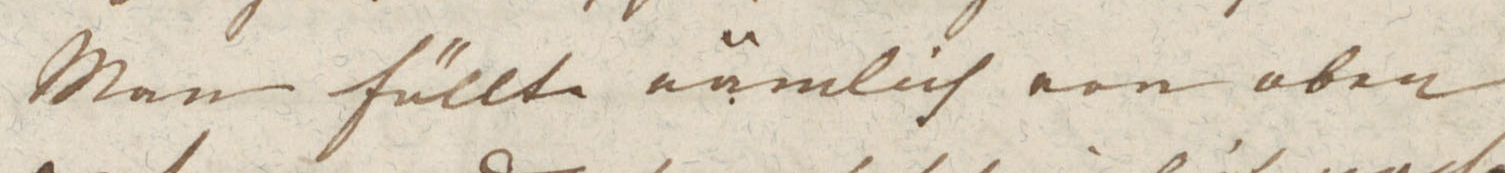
Man füllte nämlich von oben
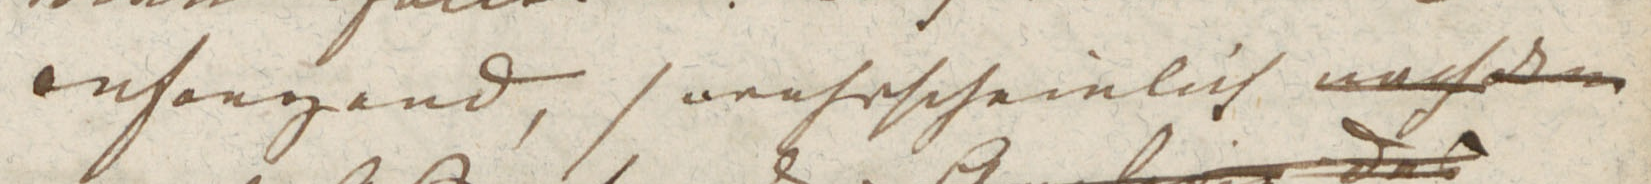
anfangend, (wahrscheinlich nachdem
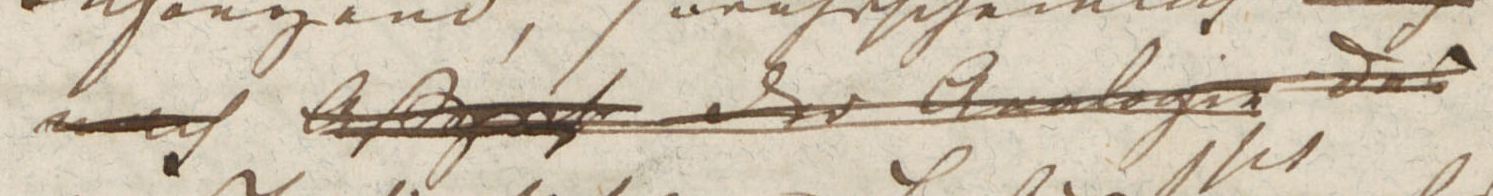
nach Assyrisc der Analogie des
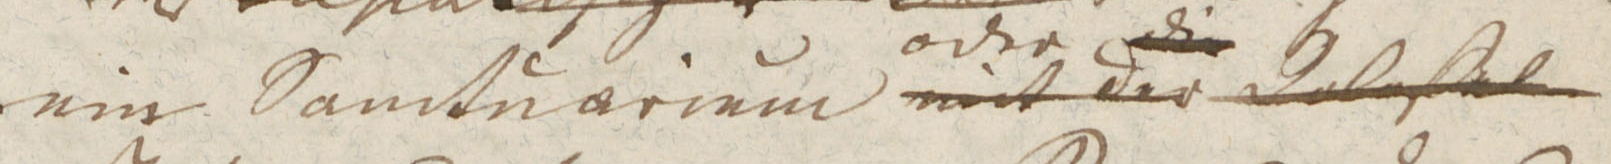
ein Sanctuarium mit der oder die Kolossal
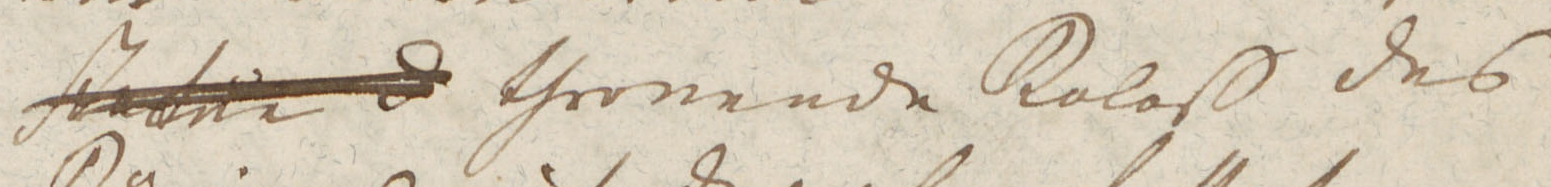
der statue d thronende Koloss des
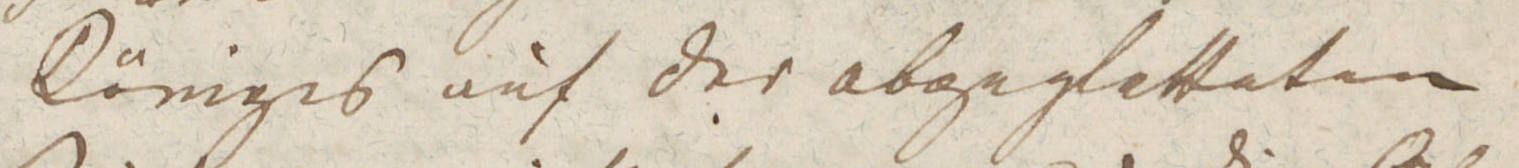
Königes auf der abgeplatteten
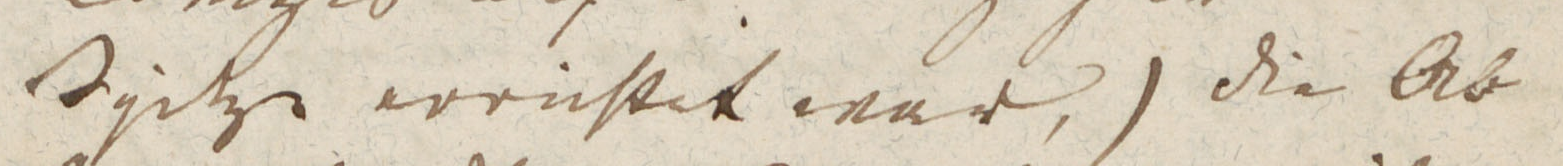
Spitze errichtet war,) die Ab
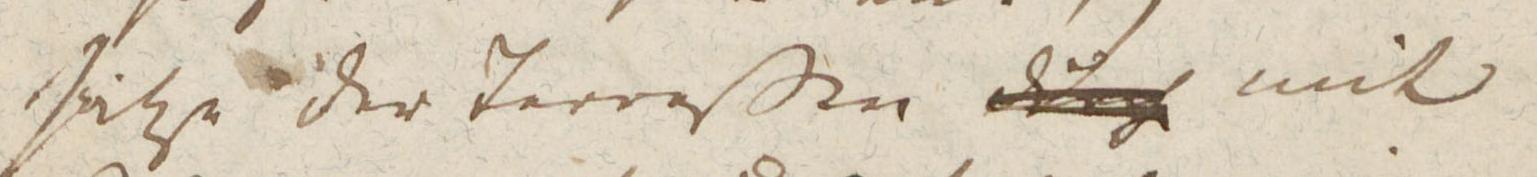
sätze der Terrassen durch mit
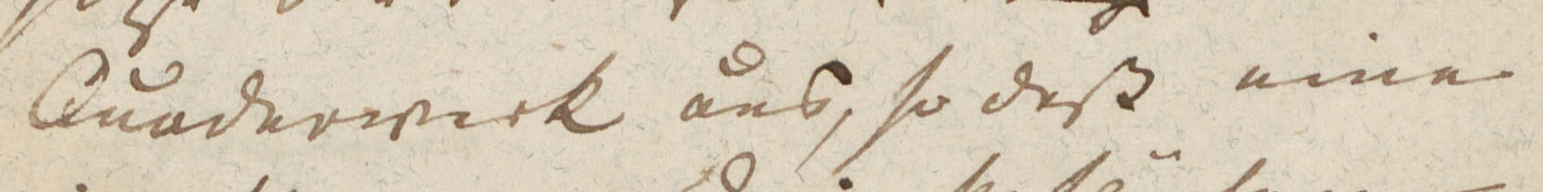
Quaderwerk aus, so dass eine
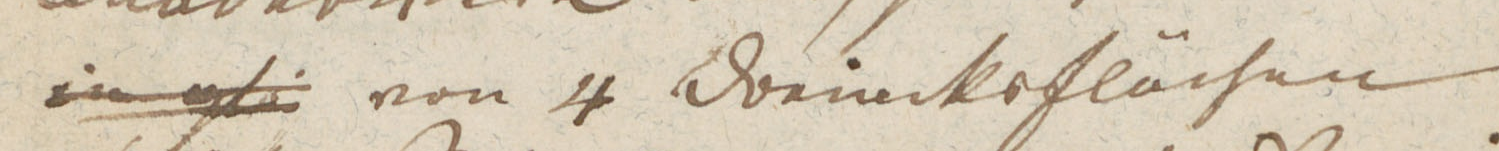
in gl von 4 Dreiecksflächen
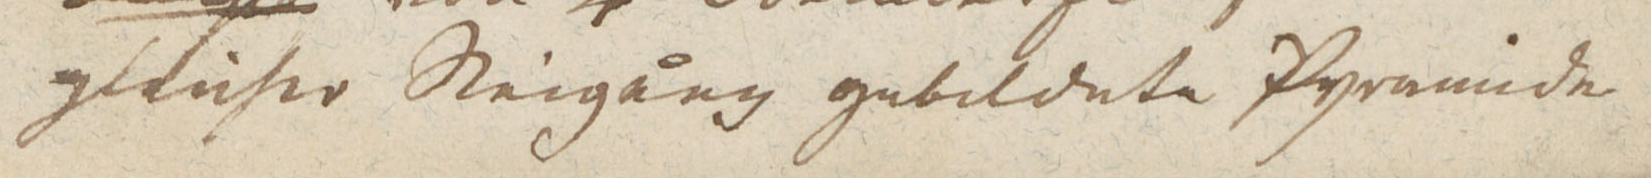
gleicher Neigung gebildete Pyramide
